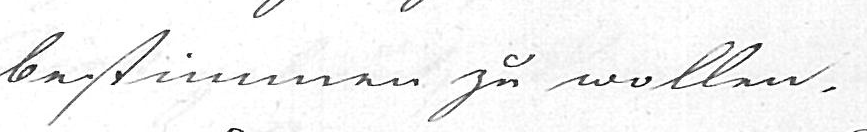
bestimmen zu wollen.
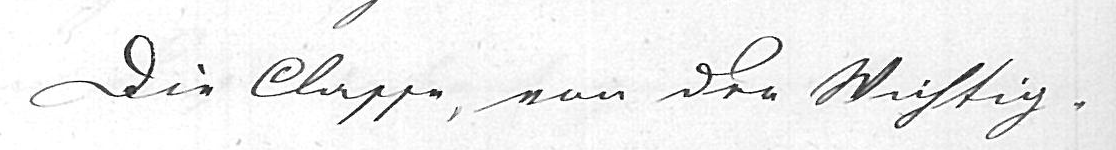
Die Classe, von der Wichtig-
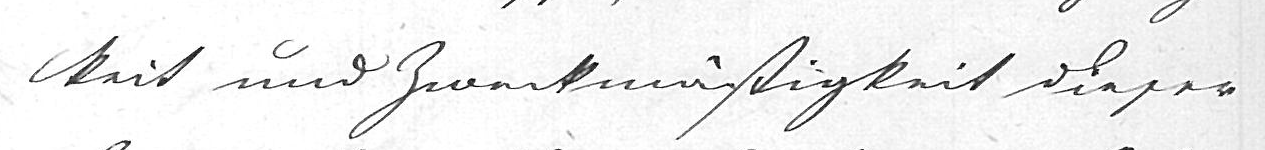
keit und Zweckmäßigkeit dieser
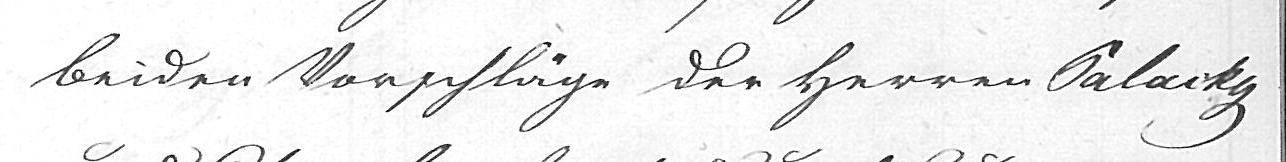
beiden Vorschläge der Herren Palacky
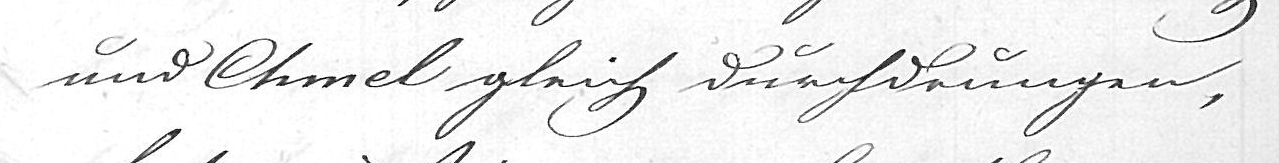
und Chmel gleich durchdrungen,
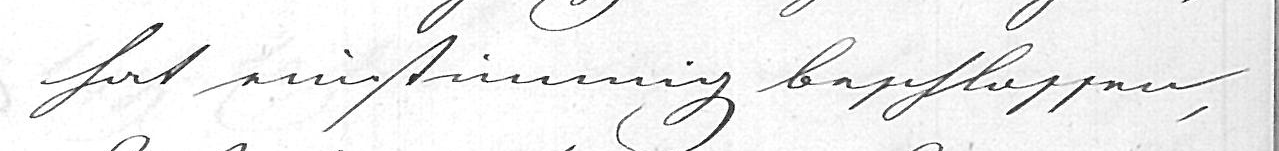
hat einstimmig beschlossen,
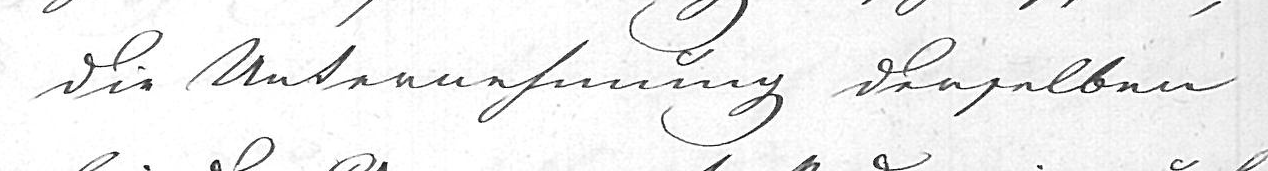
die Unternehmung derselben
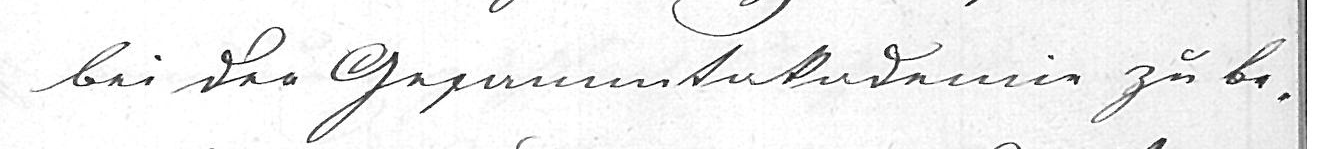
bei der Gesammtakademie zu be-
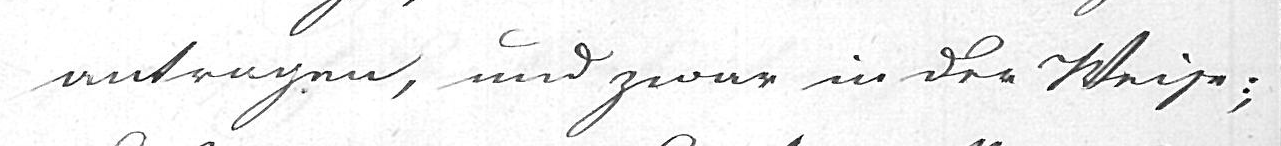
antragen, und zwar in der Weise,
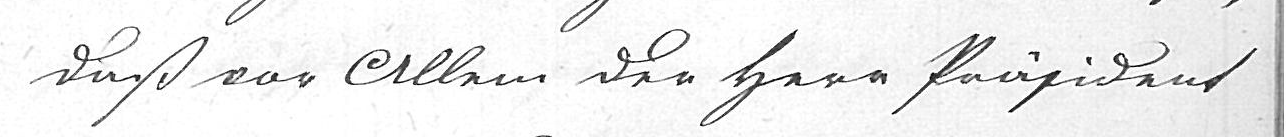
daß vor Allen der Herr Präsident
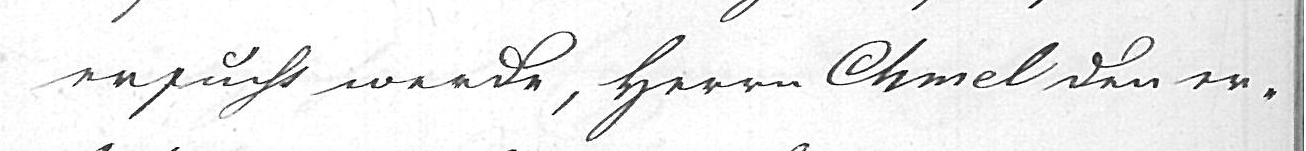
ersucht werde, Herrn Chmel den er-
